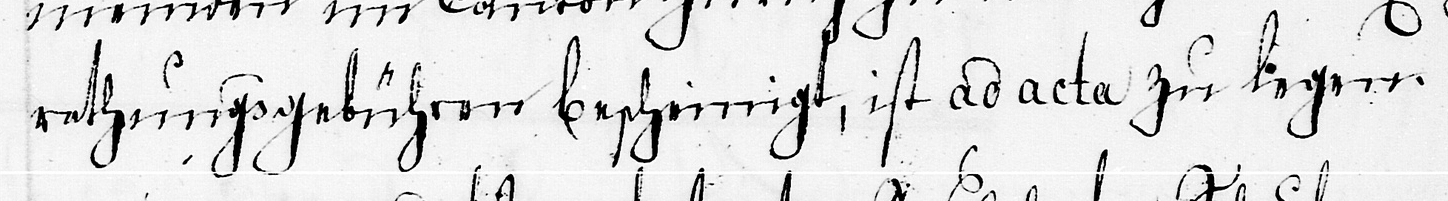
rathungsgebühren bescheinigt, ist ad acta zu legen.
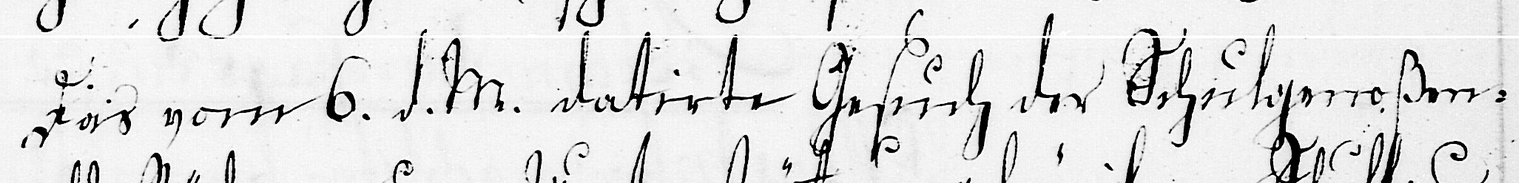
Das vom 6. d. M. datirte Gesuch der Schulgenoßen¬
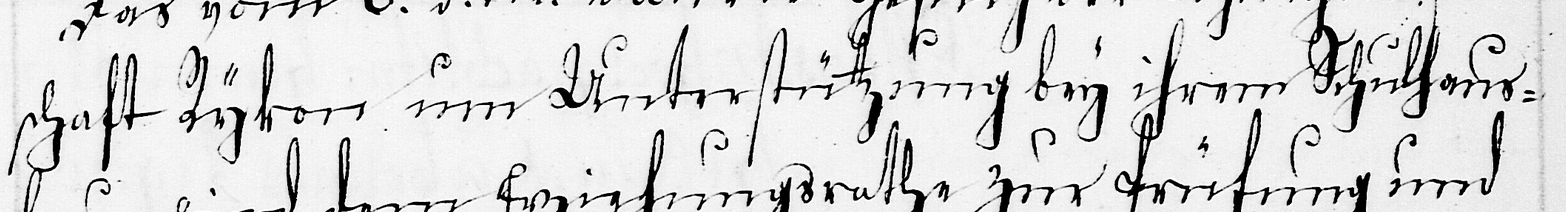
schaft Rykon um Unterstützung bey ihrem Schulhaus¬
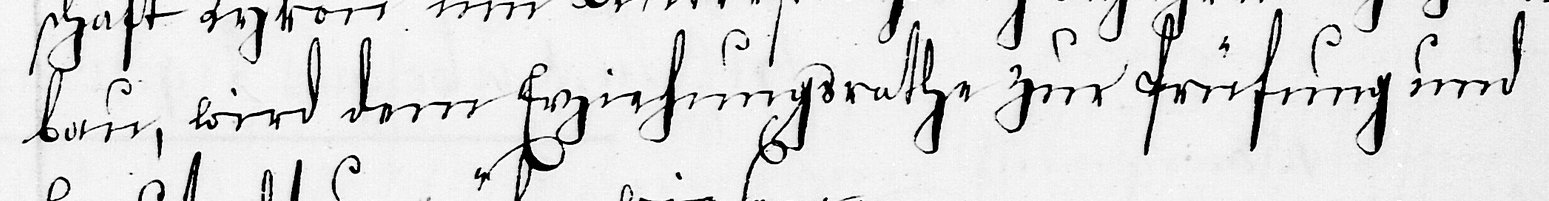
bau, wird dem Erziehungsrathe zur Prüfung und
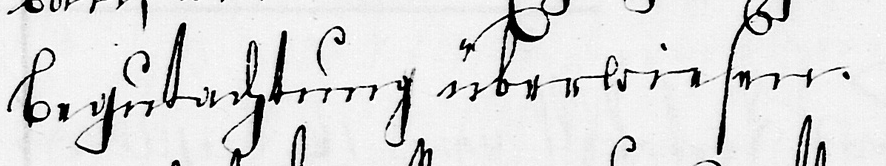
Begutachtung überwiesen.
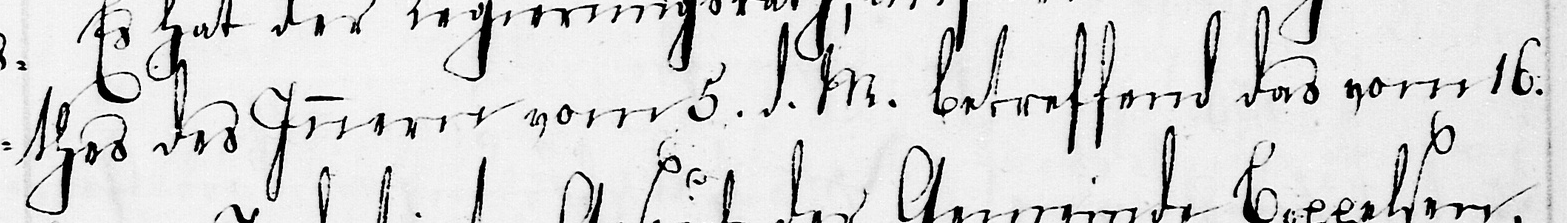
thes des Innern vom 5. d. M. betreffend das vom 16.
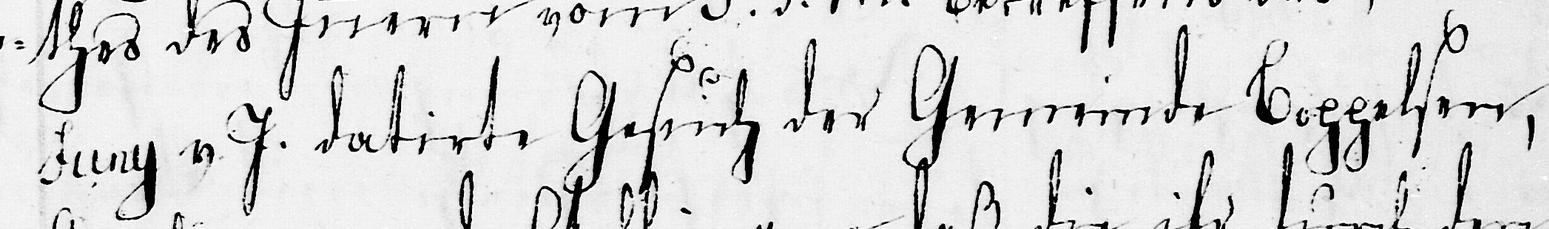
Juny v. J. datirte Gesuch der Gemeinde Boppelsen,
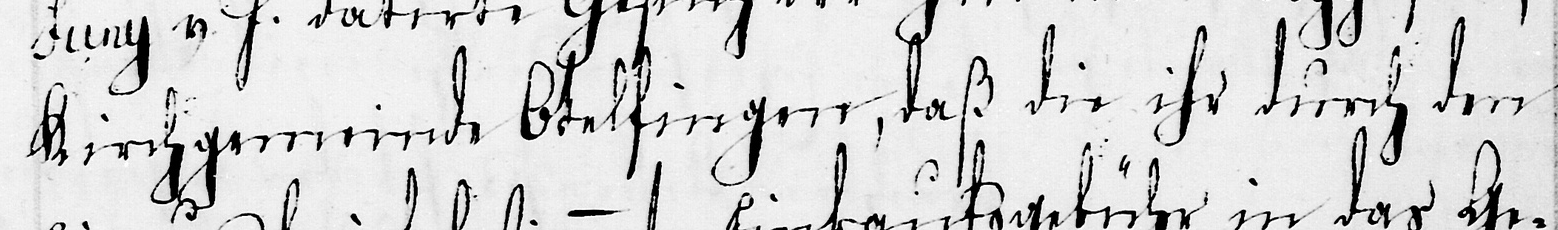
Kirchgemeinde Otelfingen, daß die ihr durch den
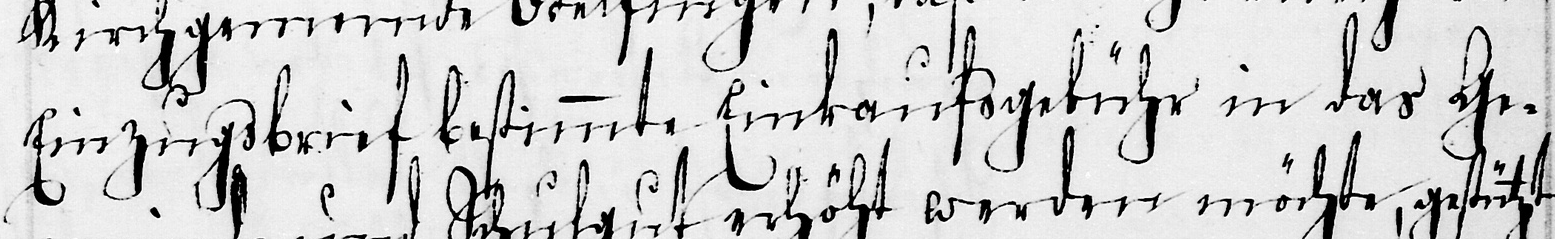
Einzugsbrief bestimmte Einkaufsgebühr in das Ge¬
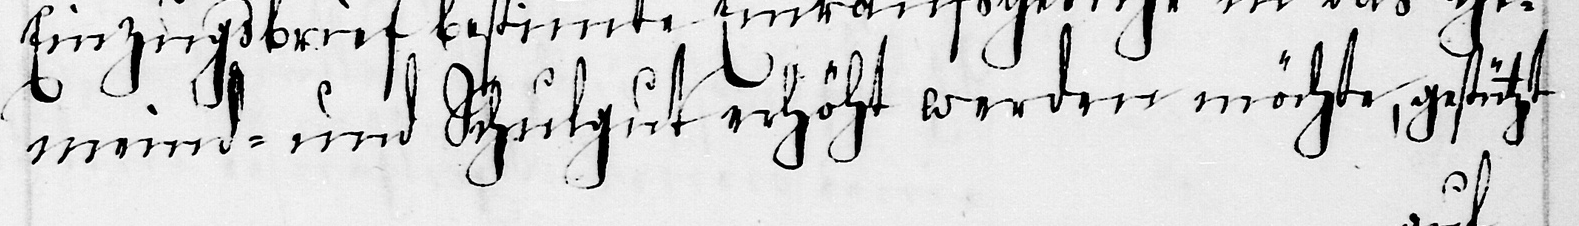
meind- und Schulgut erhöht werden möchte, gestützt
